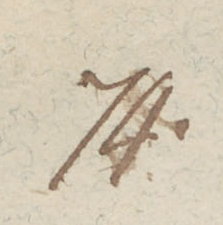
74.
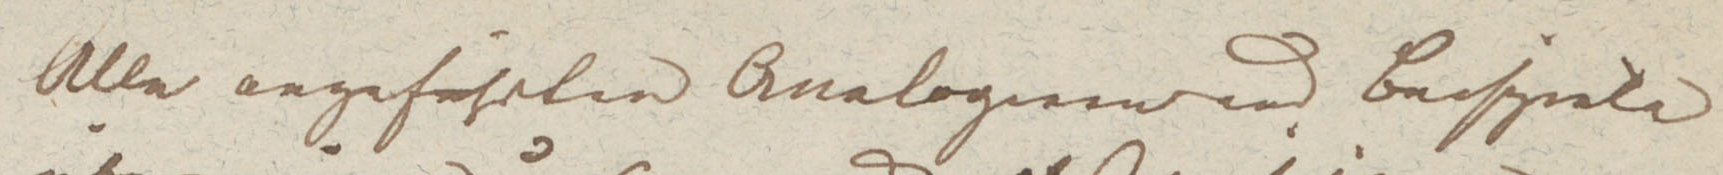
Alle angeführten Analogieen und Beispiele
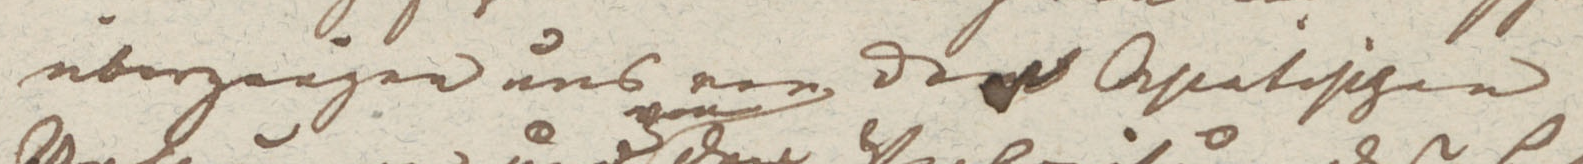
überzeugen uns von demr Asiatischen
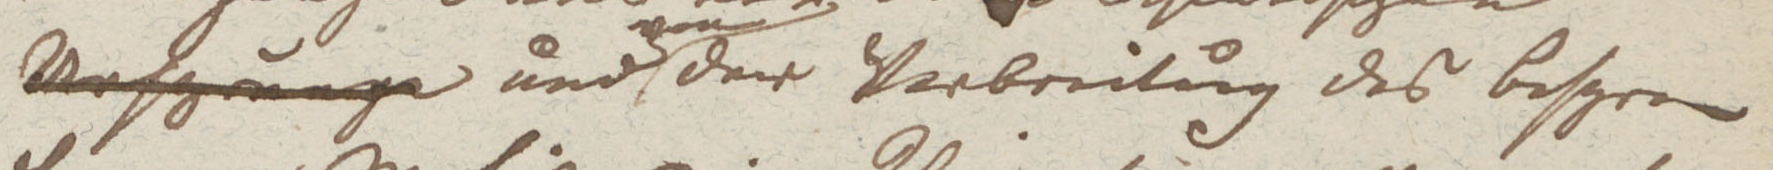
Ursprunge und von der Verbreitung des bespro-
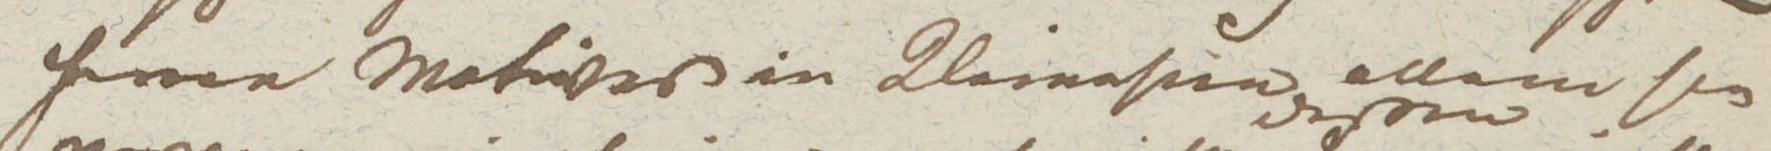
chenen Motives in Kleinasien allein sie
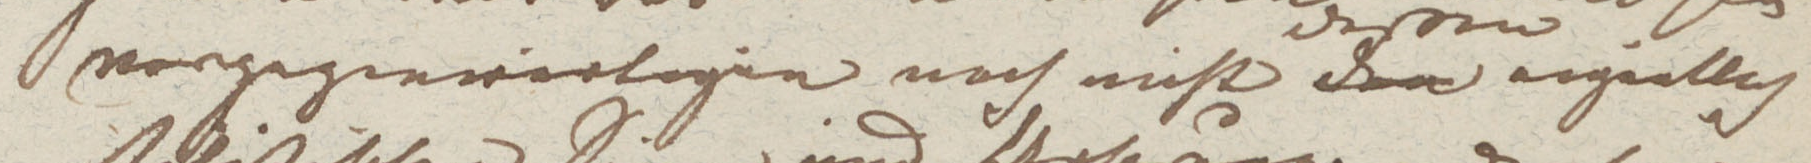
vergegenwärtigen noch nicht den dessen eigentlich
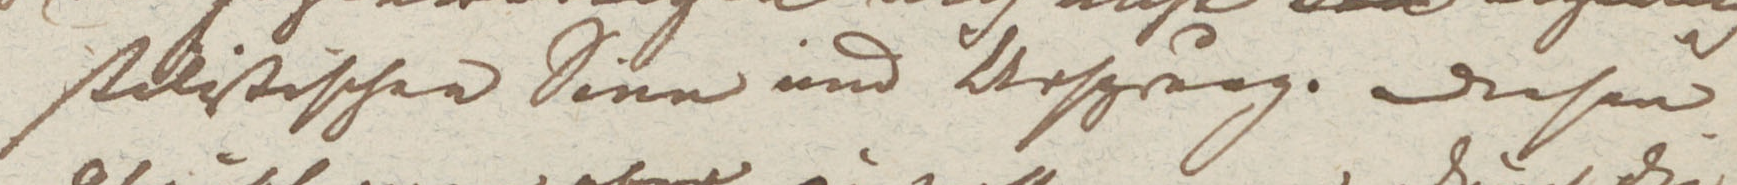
stilistischen Sinn und Ursprung. Diesen
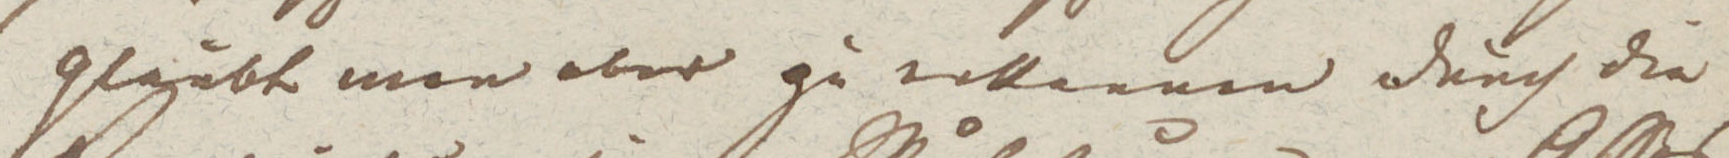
glaubt man aber zu erkennen durch die
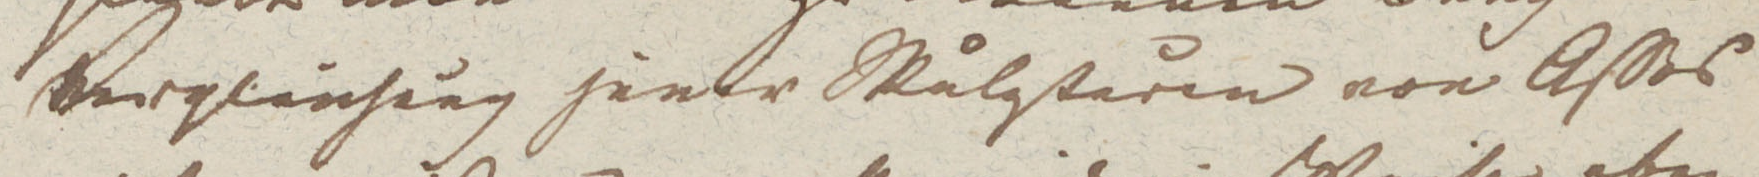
Vergleichung jener Skulpturen von Assos
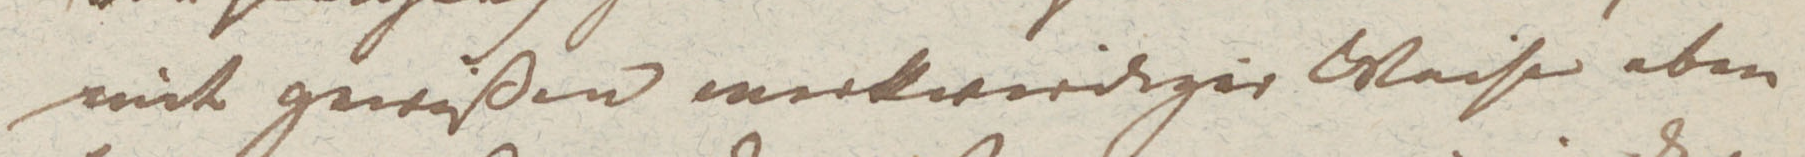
mit gewissen merkwürdiger Weise eben
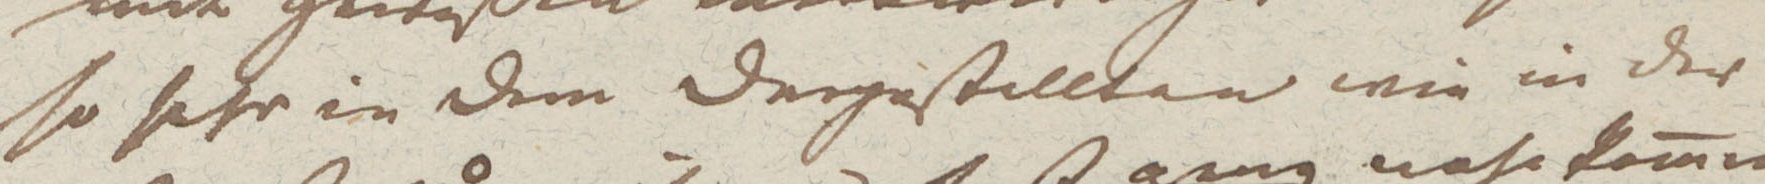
so sehr in dem Dargestellten wie in der
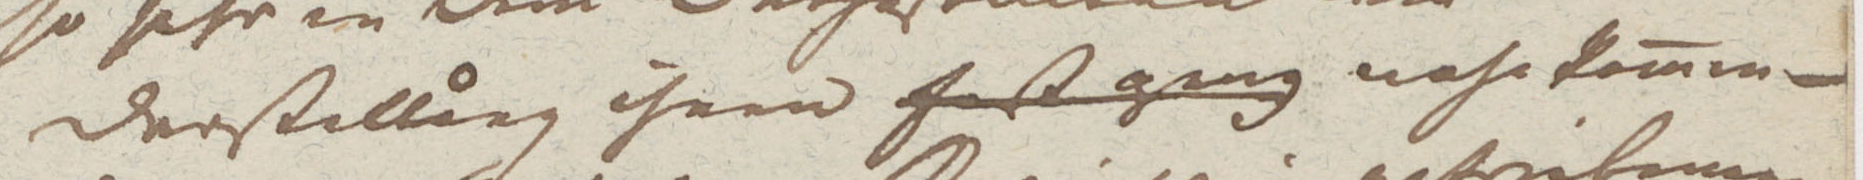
Darstellung ihnen fast ganz nahe kommen-
